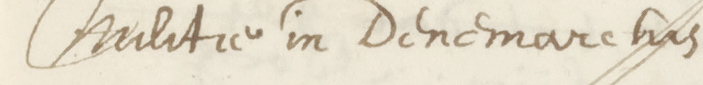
Militie in Denemarcken
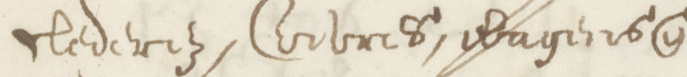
clederen, Vivres, wagens &
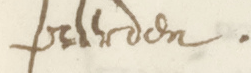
peerden.
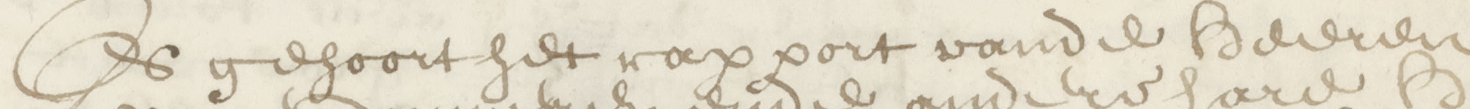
Is gehoort het rapport vande Heeren
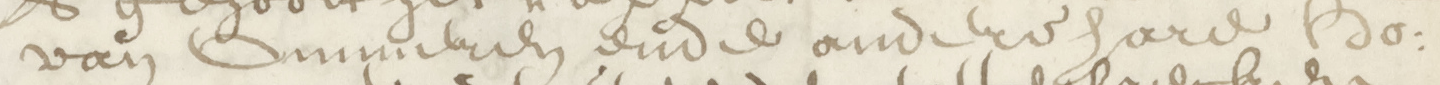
van Ommeren, ende andere hare Ho:
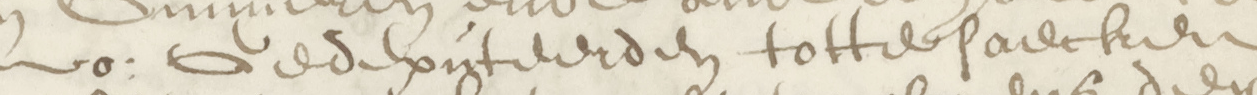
Mo: Gedeputeerden totte saecken
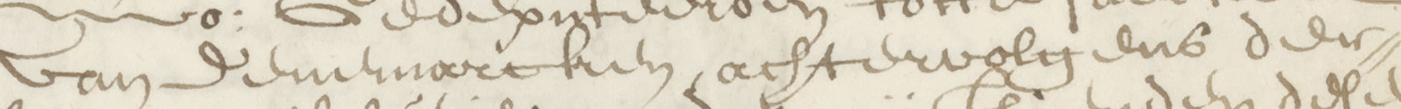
van Denemarcken, achtervolgens der„
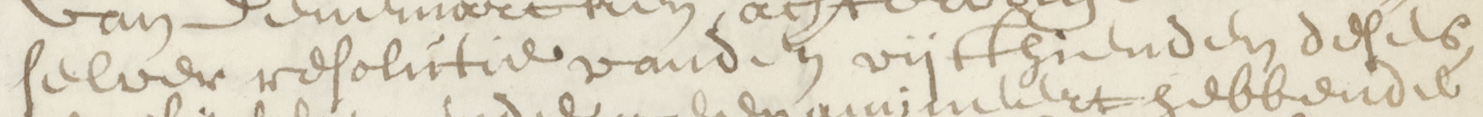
selver resolutie vanden vijfthienden deses,
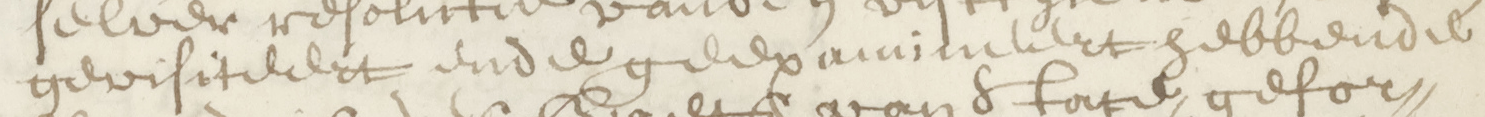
gevisiteert ende geexamineert hebbende
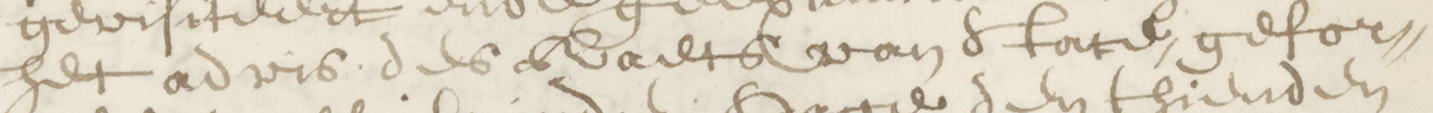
het advis des Raets van State, gefor„
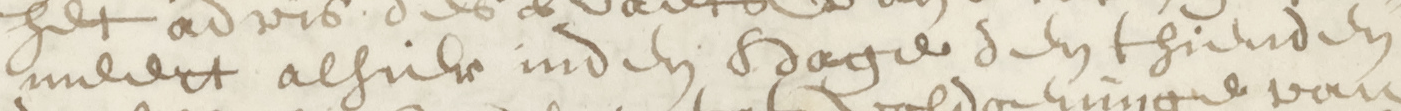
meert alhier inden Hage den thienden
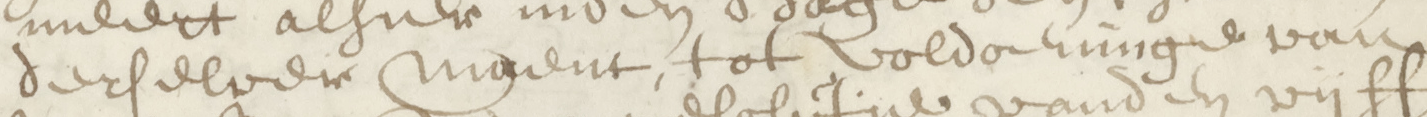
derselver Maent, tot voldoeninge van
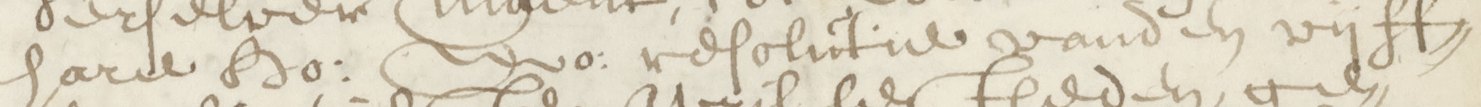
hare Ho:Mo: resolutie vanden vijff„
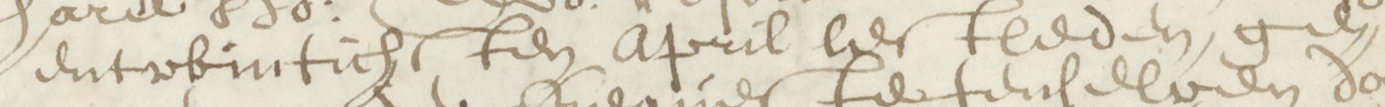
entwintichsten April lestleden, ge„
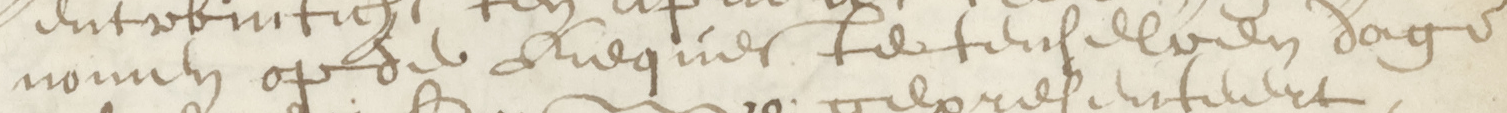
nomen opde Requeste tenselven dage
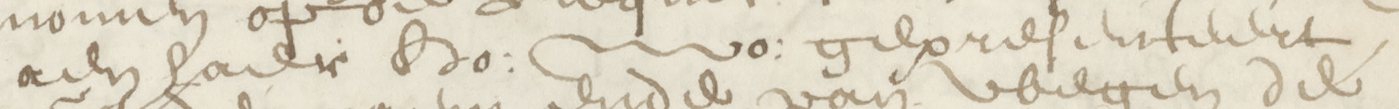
aen haer Ho:Mo: gepresenteert,
